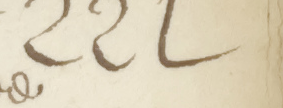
221
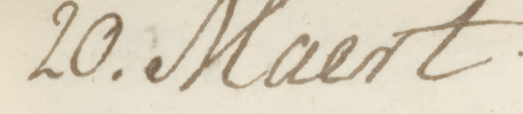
20. Maert.
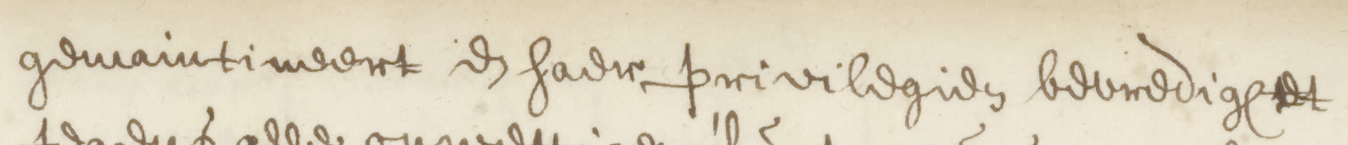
gemaintineert en haer privilegien bevredighet
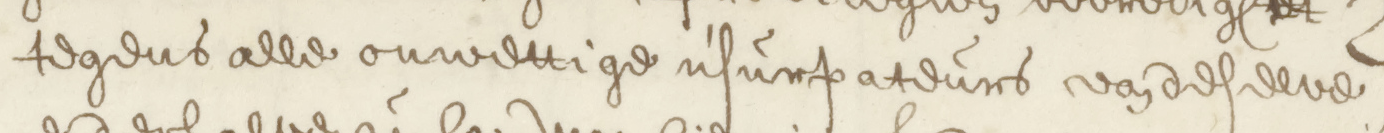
tegens alle onwettige usurpateurs van deselve,
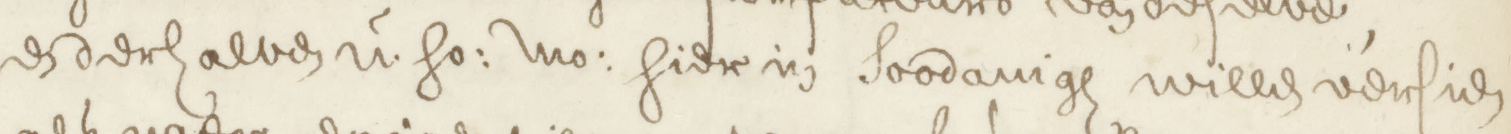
en derhalven u ho:Mo: hier in soodanigh willen versien,
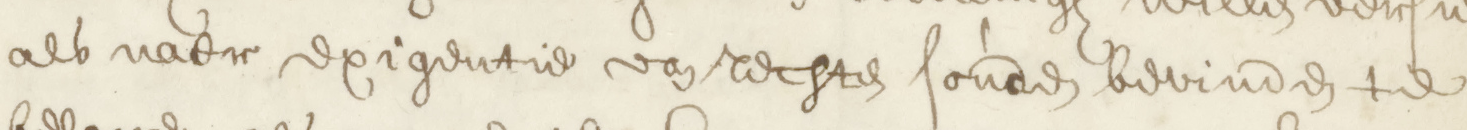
als naer exigentie van rechten souden bevinden te
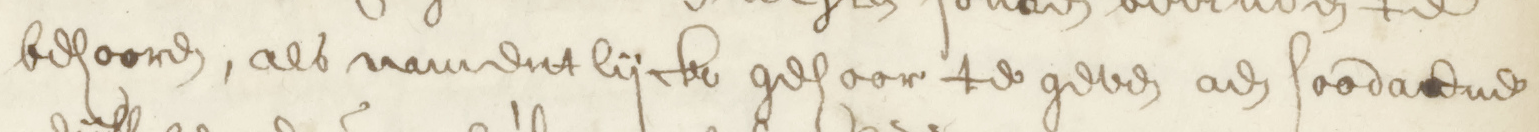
behooren, als namentlijck gehoor te geven aen soodaene
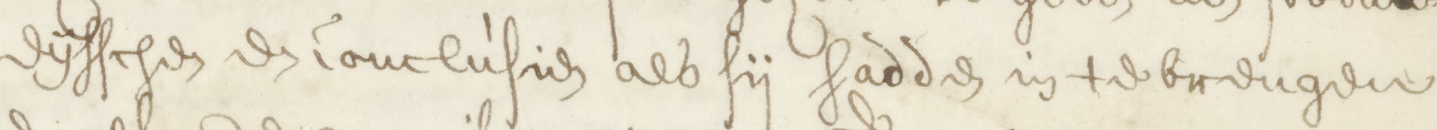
eijsschen en Conclusien als sij hadden in te brengen
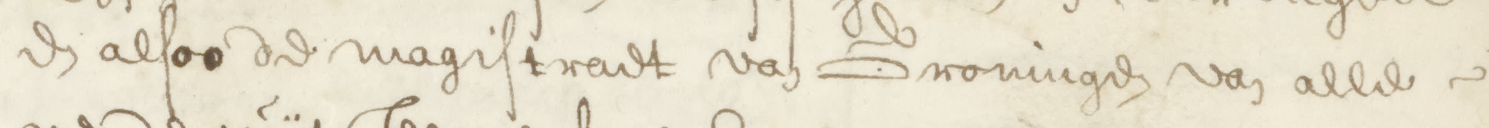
en alsoo de magistraet van Groningen van alle
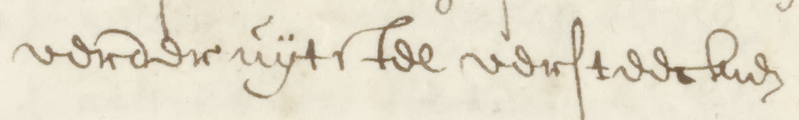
verder uijtstel versteecken.
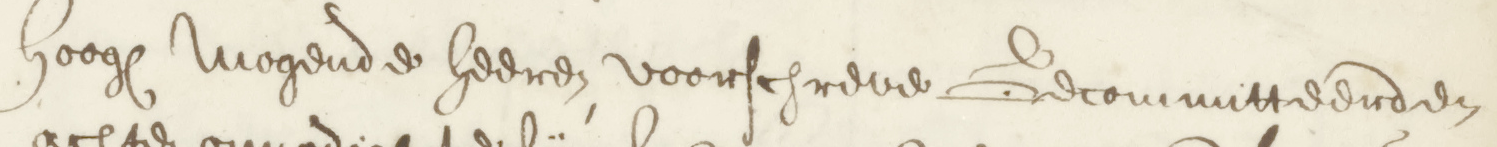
Hoogh Mogende heeren, voorschreve Gecommitteerden
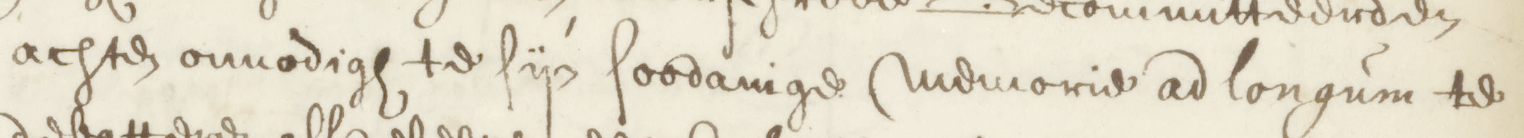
achten onnodigh te sijn soodanige memorie ad longum te
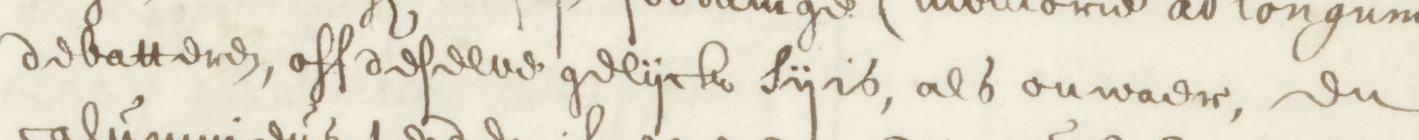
debatteren, off deselve gelijck sijns, als onwaer, en
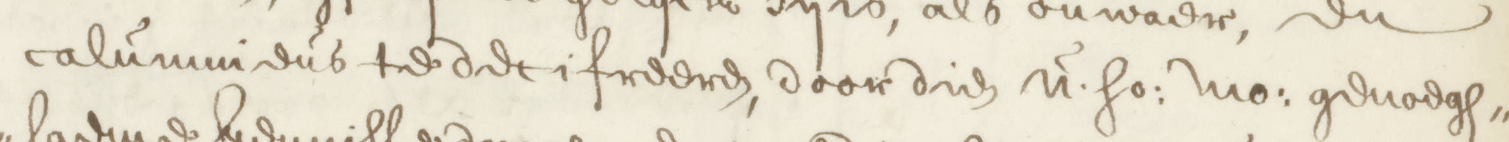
calumnieus te decifreeren, door dien U. ho:Mo: genoegh„
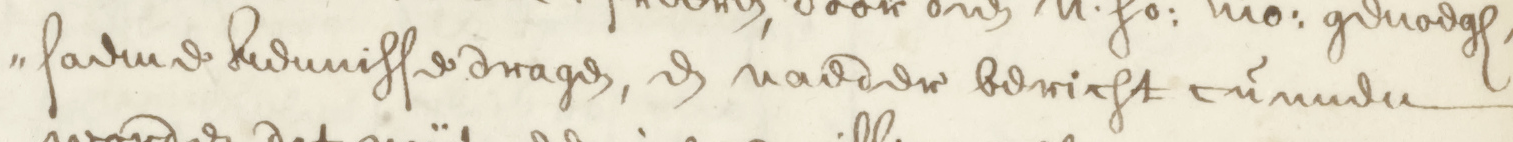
„saeme kennisse dragen, en naeder bericht cunnen
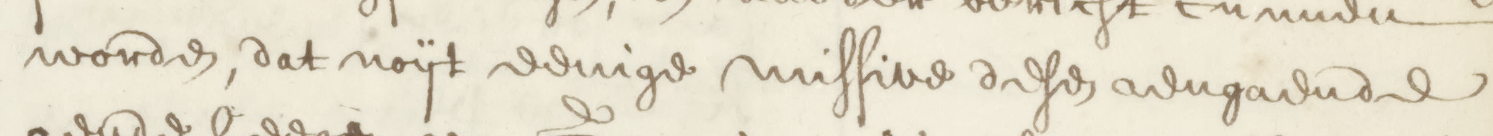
worden, dat noijt eenige missive desen aengaende
